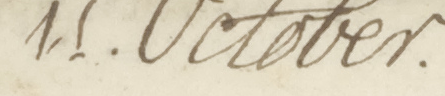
11. October.
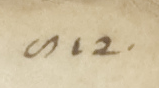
812.
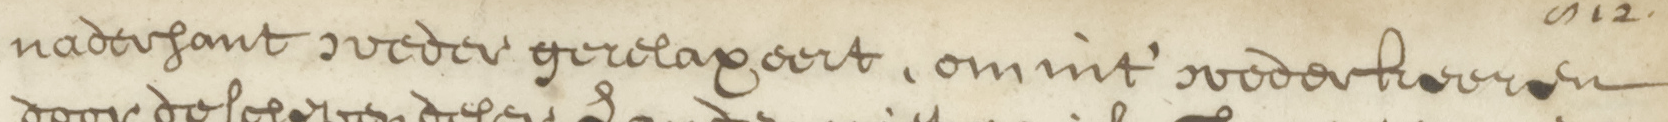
naderhant weder gerelaxeert, om int' wederkeeren
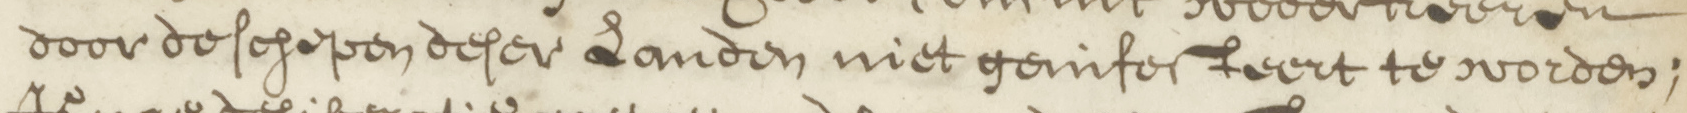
door de schepen deser Landen niet geinfesteert te worden;
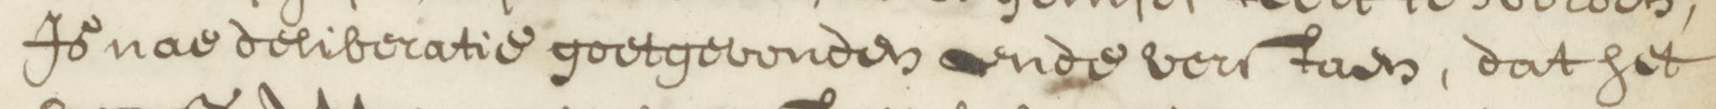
Is nae deliberatie goetgevonden ende verstaen, dat het
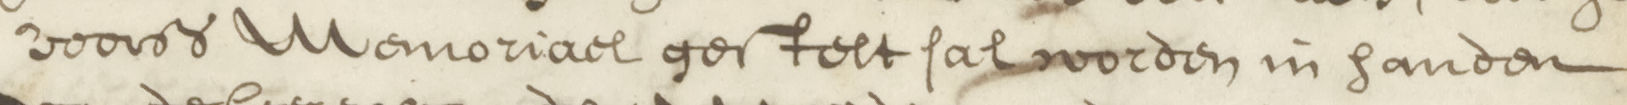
voorsz Memoriael gestelt sal worden in handen
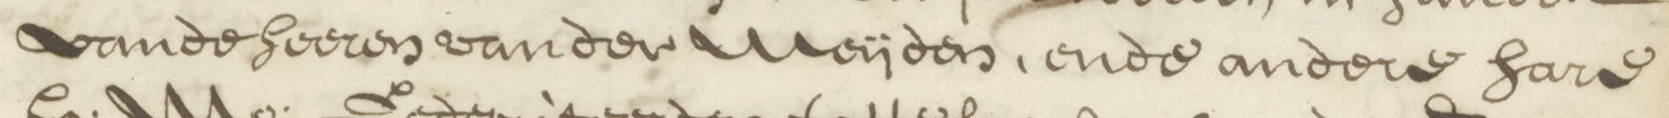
vande heeren van der Meijden, ende andere hare
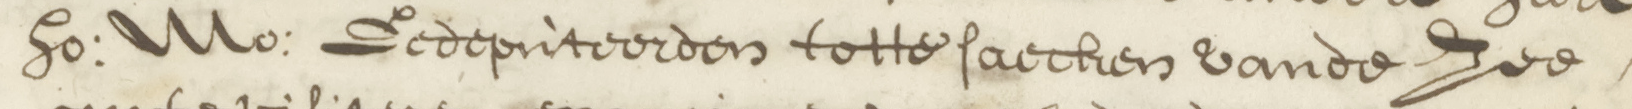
Ho:Mo: Gedeputeerden totte saecken vande Zee,
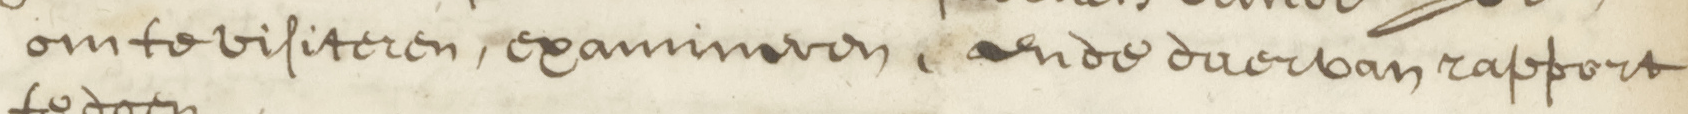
om te visiteren, examineren, ende daervan rapport
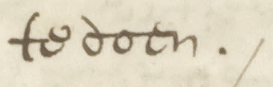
te doen.
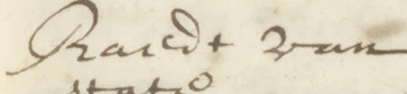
Raedt van
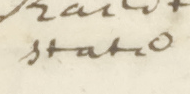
state
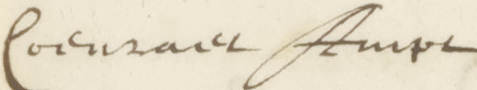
Coenraet Ampt
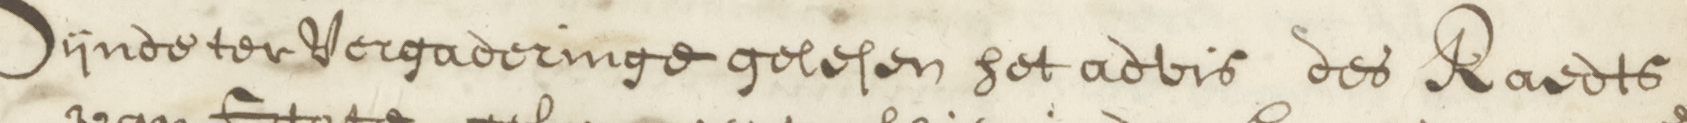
Sijnde ter Vergaderinge gelesen het advis des Raedts
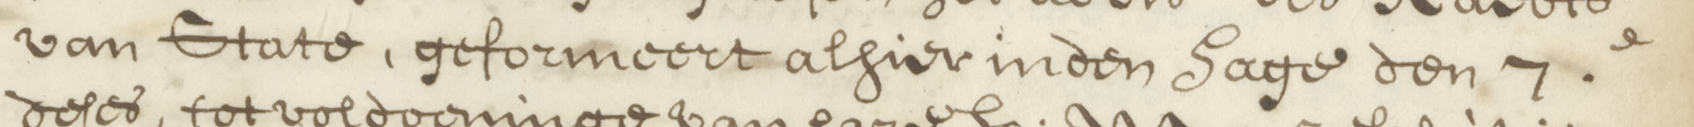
van State, geformeert alhier in den Hage den 7e.
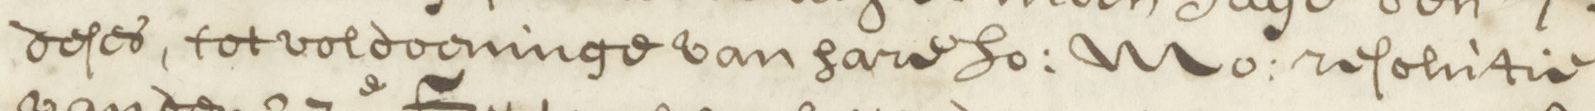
deses, tot voldoeninge van hare Ho:Mo: resolutie
